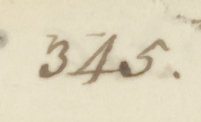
345
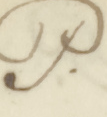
P
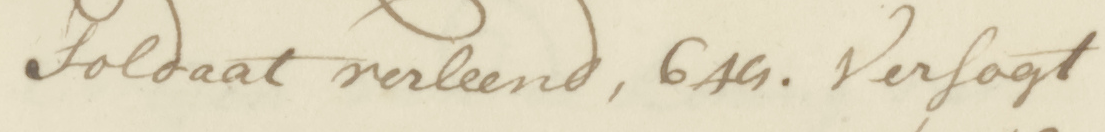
soldaat verleend, 648. Versogt
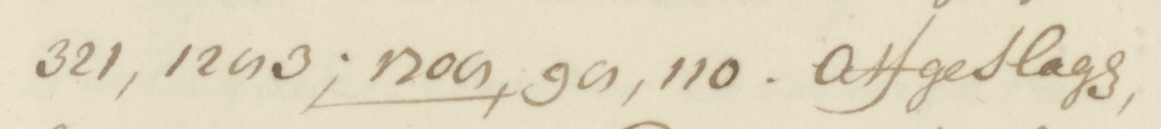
321, 1283; 1708, 98, 110. Affgeslagen
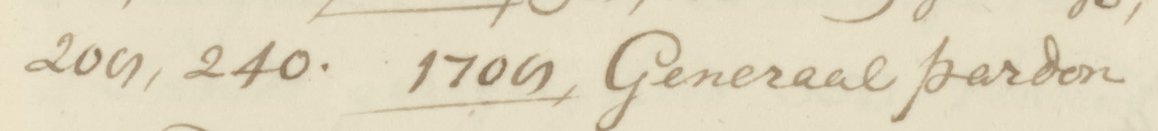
208, 240. 1708, Generaal pardon
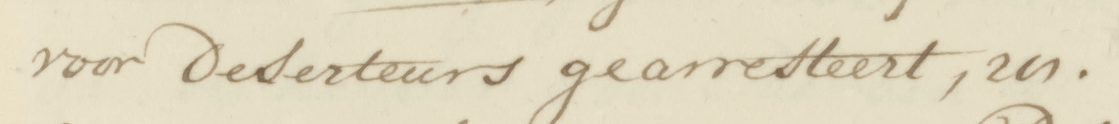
voor deserteurs gearresteert, 28.
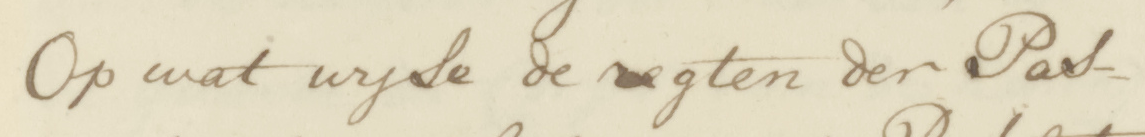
Op wat wyse de regten der Pas„
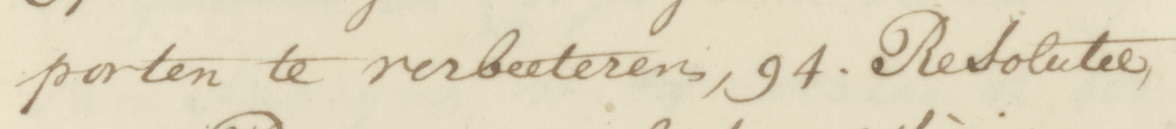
porten te verbeeteren, 94. Resolutie
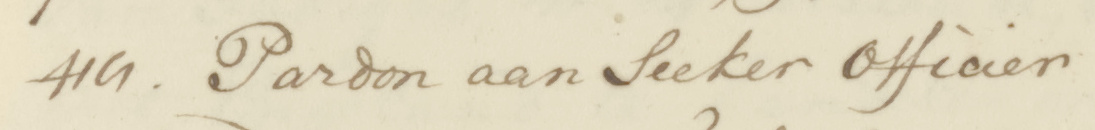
418. Pardon aan seeker officier
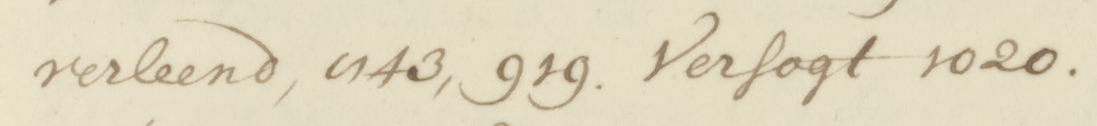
verleend, 843, 919. Versogt 1020.
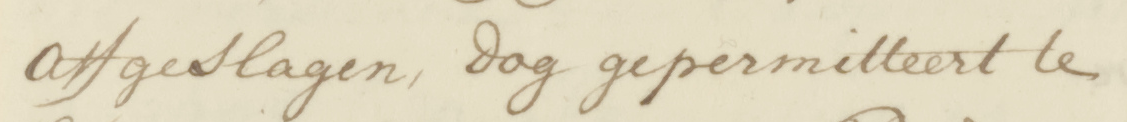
Affgeslagen, dog gepermitteert te
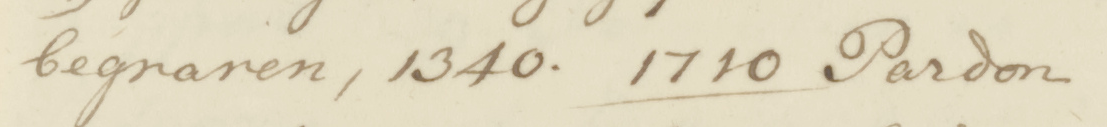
begraven, 1340. 1710 Pardon
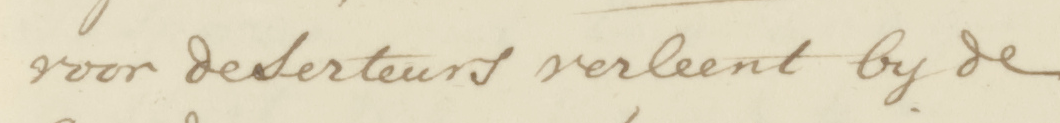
voor deserteurs verleent bij de
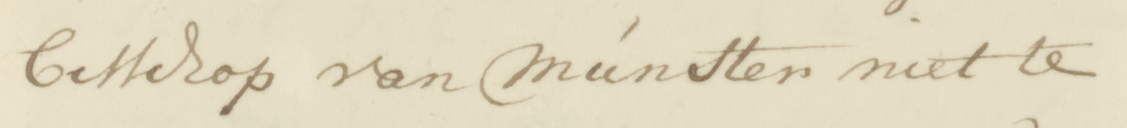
bisschop van Munster niet te
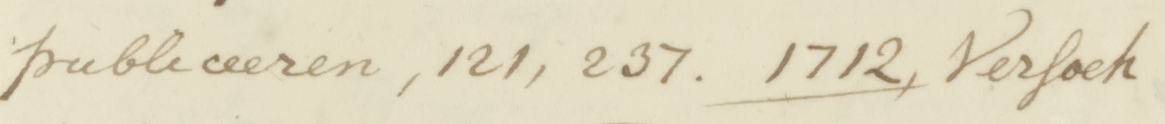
publiceeren, 121, 237. 1712 Versoek
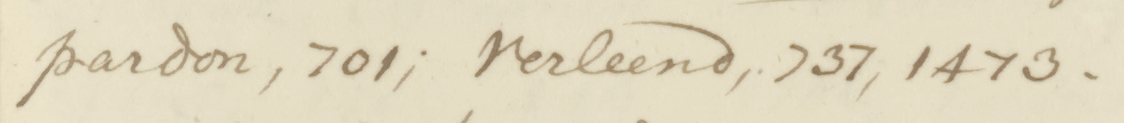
pardon, 701; Verleend, 737, 1473.
